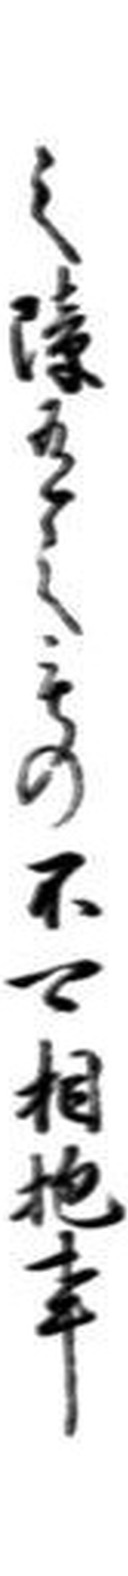之障有之もの不可相抱事
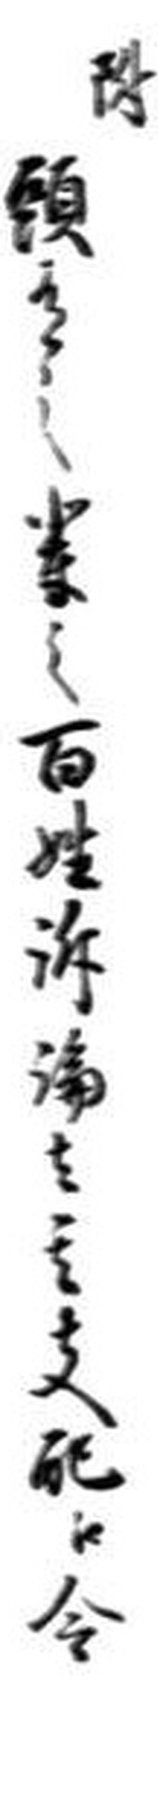頭有之輩之百姓訴論者其支配江令
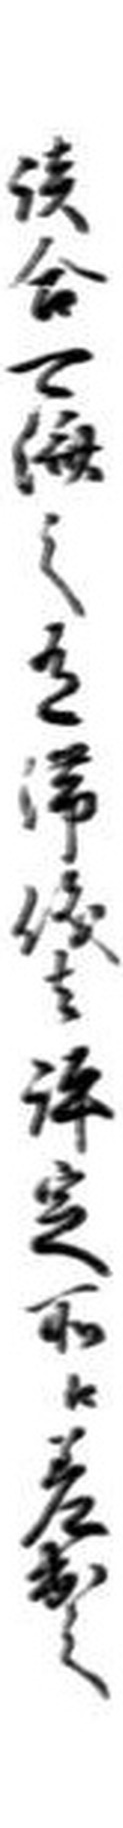談合可済之有滞儀者評定所江差出之

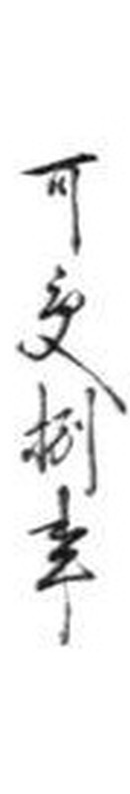可受捌事
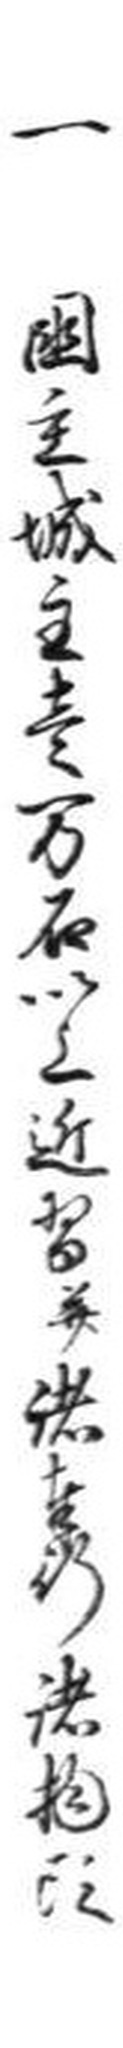一国主城主壱万石以上近習并諸奉行諸物頭
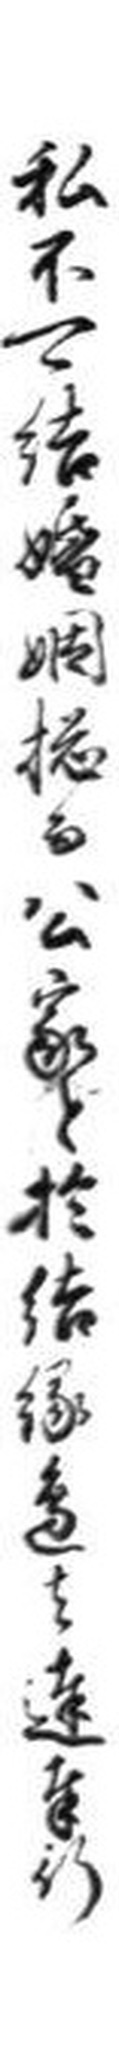私不可結婚姻捴而公家と於結縁辺者達奉行
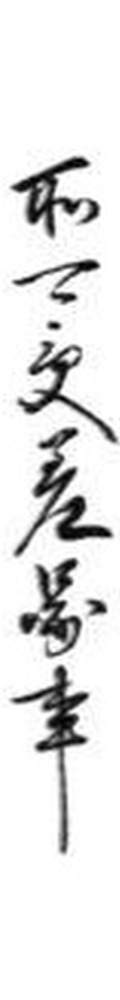所可受差図事
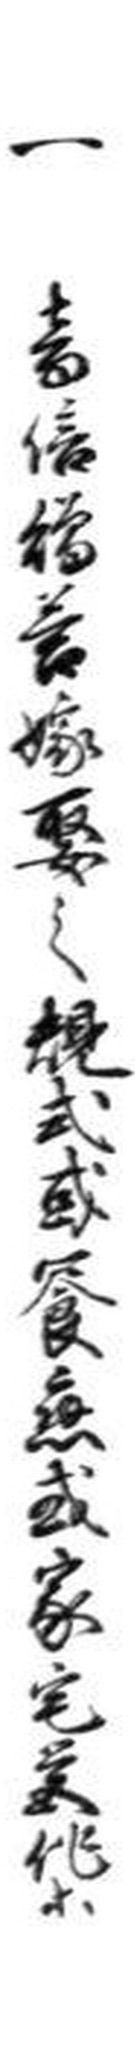一音信贈答嫁娶之規式或饗応或家宅営作等
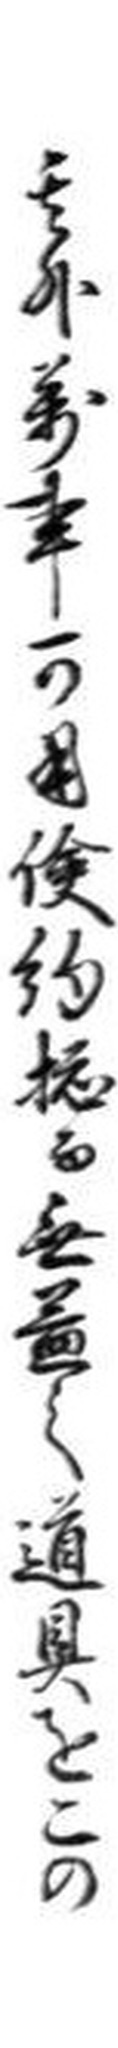其外万事可用倹約捴而無益之道具をこの
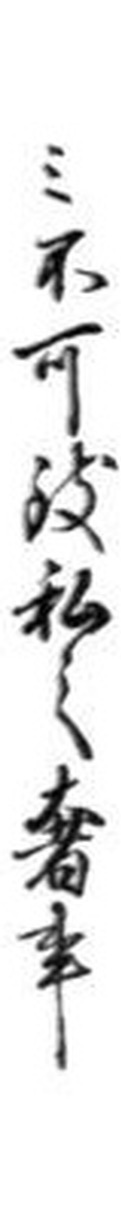ミ不可致私之奢事
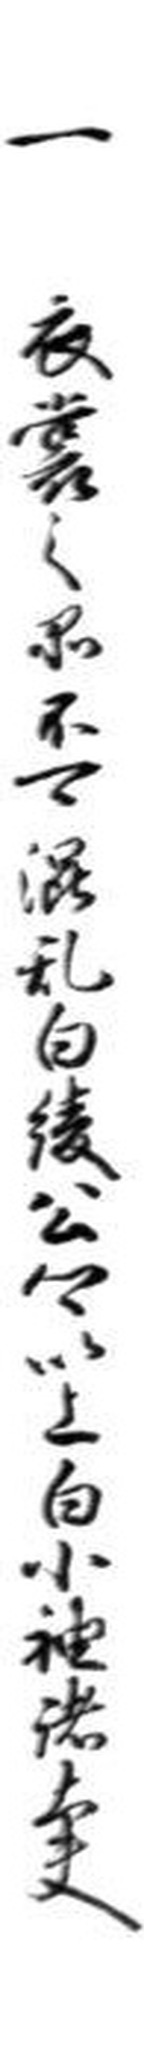一衣裳之品不可混乱白綾公卿以上白小袖諸大夫
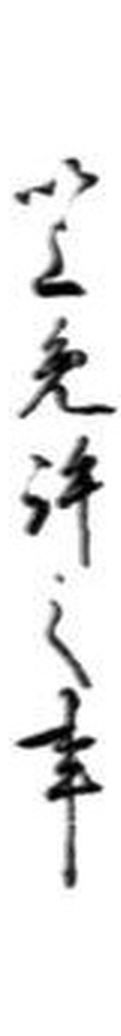以上免之事
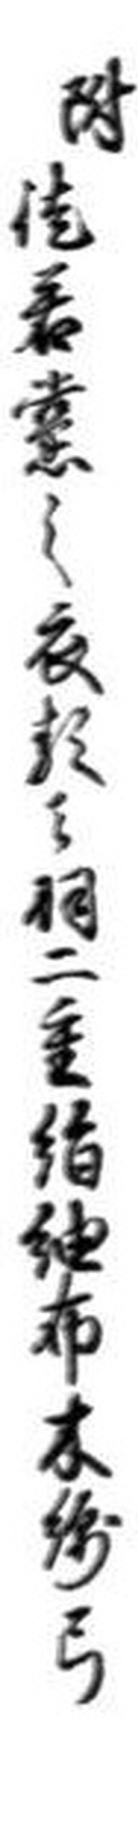徒若党之衣類者羽二重絹紬布木綿弓
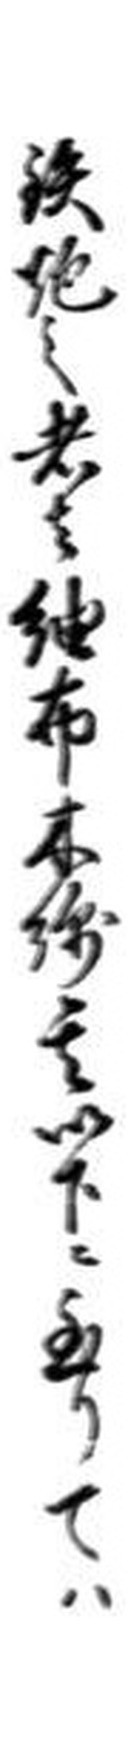鉄炮之者者紬布木綿其以下ニ至りてハ
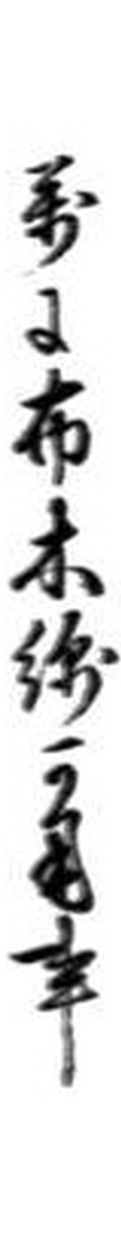万に布木綿可用事
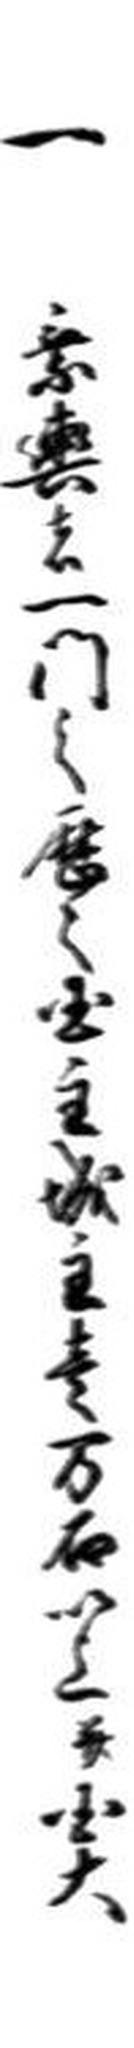一乗輿者一門之歴々国主城主壱万石以上并国大
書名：家譜 三十二 吉邦公 従享保二年到享保三年
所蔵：福井県文書館 Fukui Prefectural Archives
